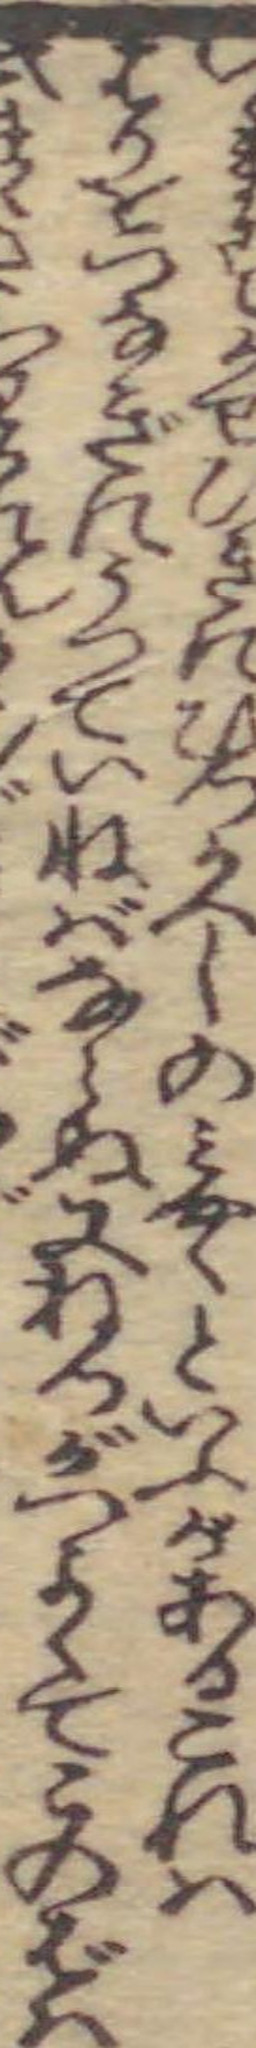はりをつなぎにうつていねばならぬ又ねつがつよくてこのばは
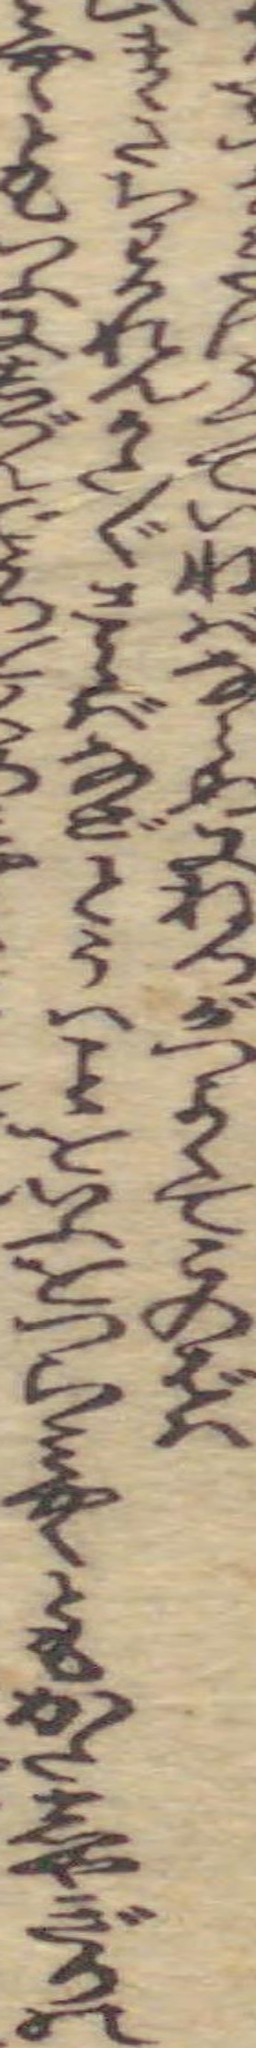此まゝたちわかれんかた〴〵さらばなどとういことをいふをつらみやくともかたしやぎりの
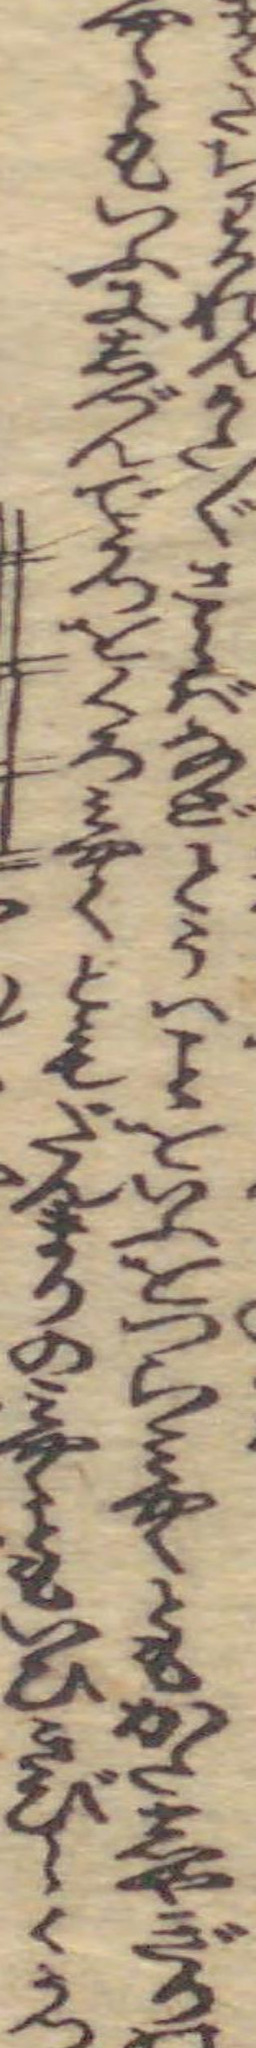みやくともいふにしづんでうつをくろみやくともだんまりのみやくともいひきびしくうつを
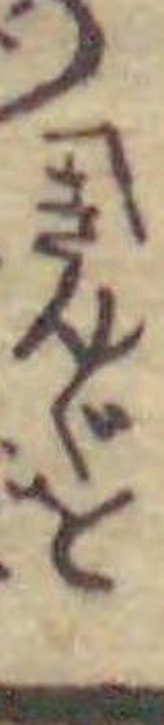〽きん〴〵を
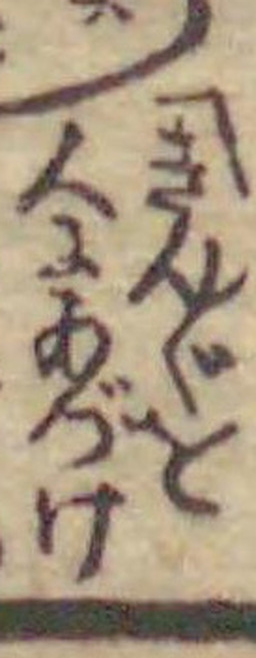人にあづけ
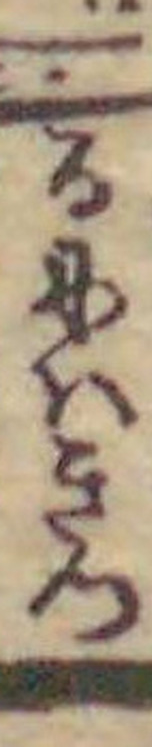るにはきつ
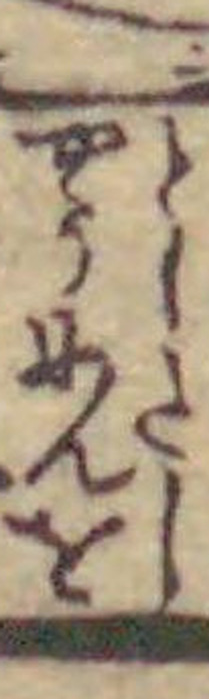やうにんを
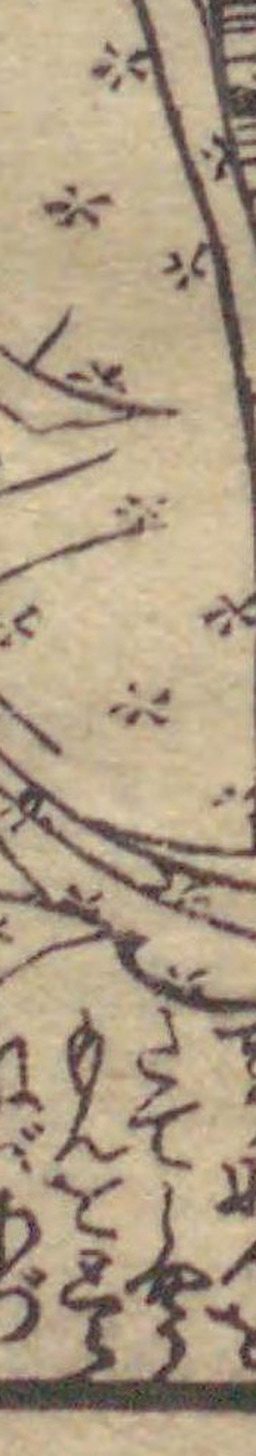もんをとら
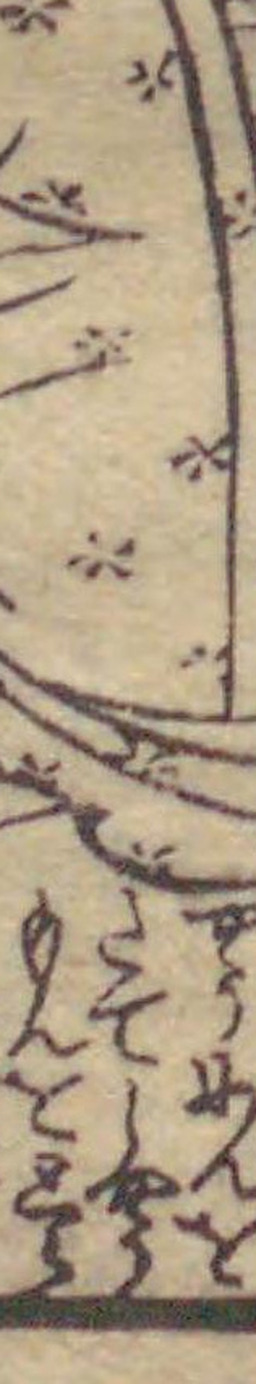たてしやう
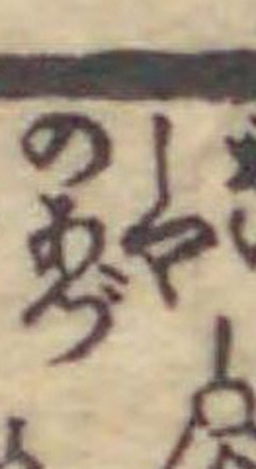のあづ
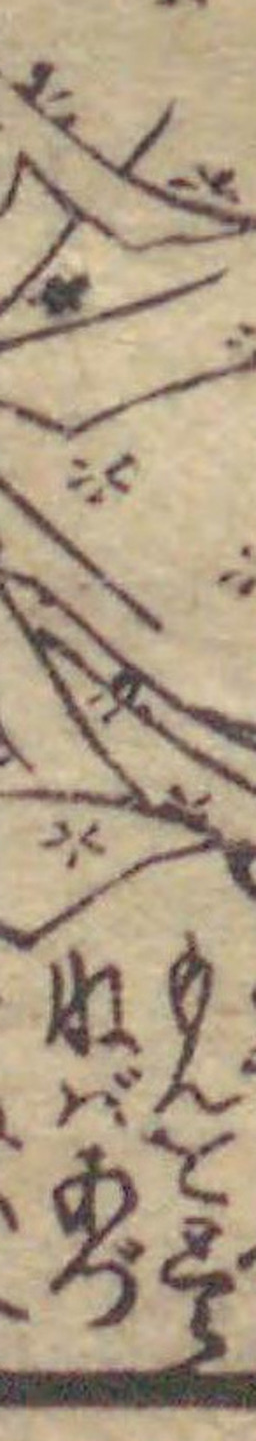ねばあづ
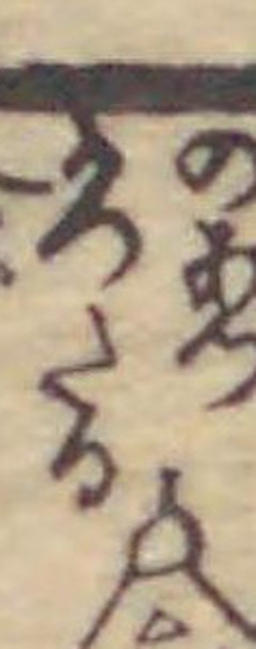かつたる
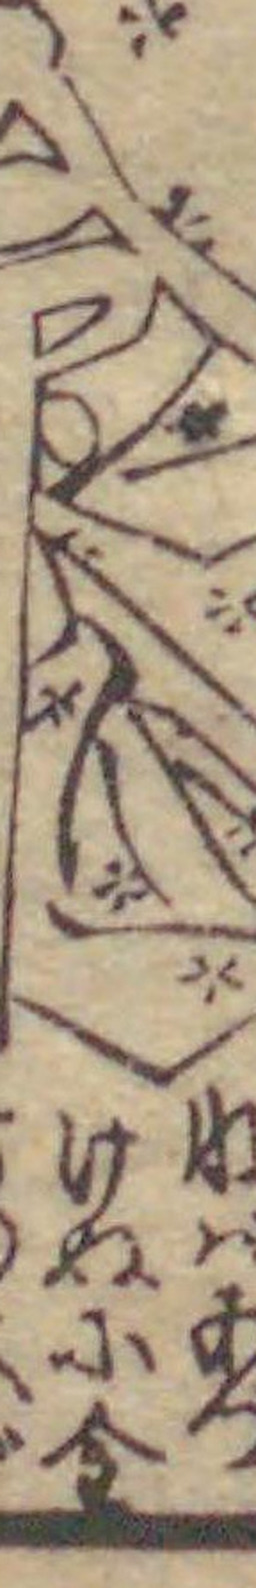けぬに金
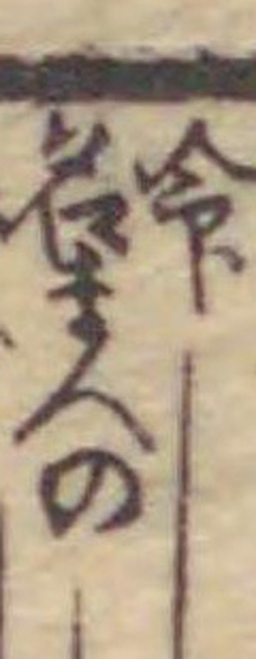名まへの
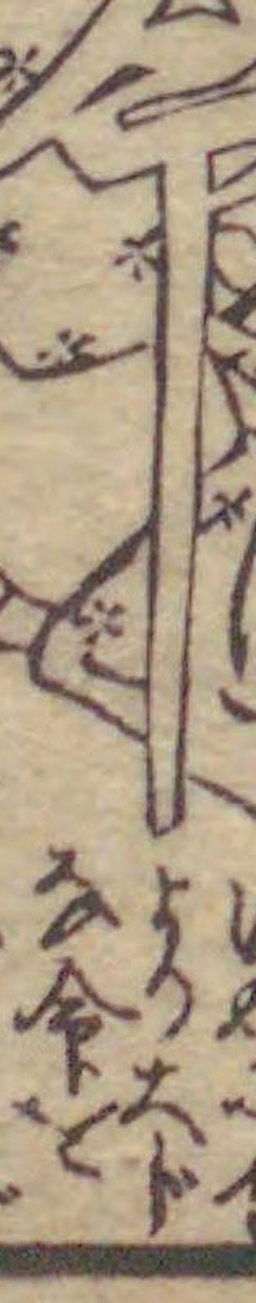な命を
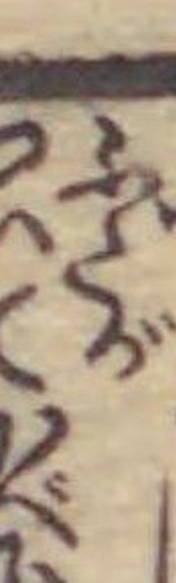ふたが
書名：御誂染長寿小紋 : 3巻
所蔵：国立国会図書館 National Diet Library, JAPAN
